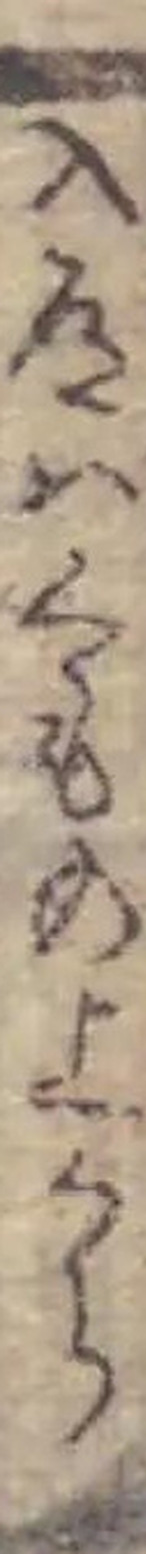入道はくもの上から
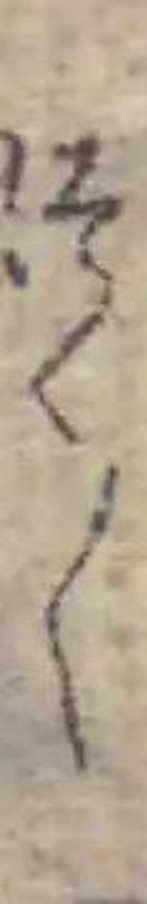つく〳〵
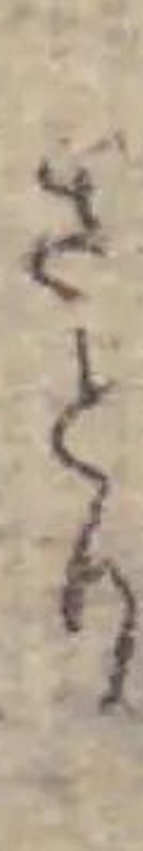さとり
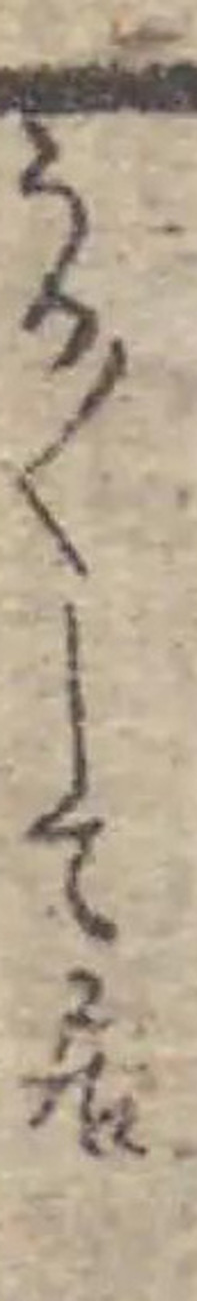うか〳〵して居
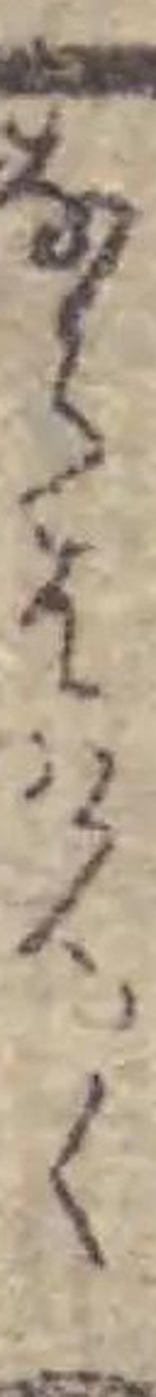ならはけつく
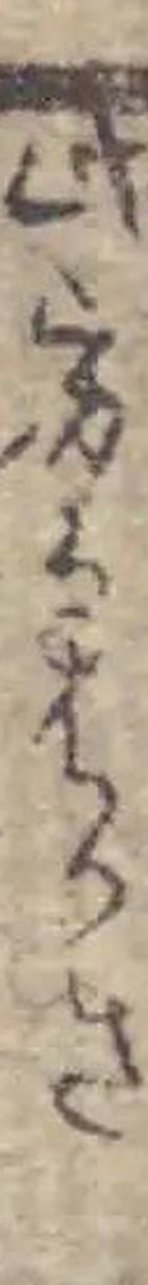此方かはかさ
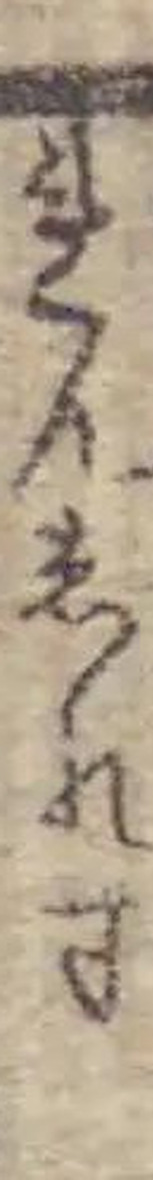れんしれす
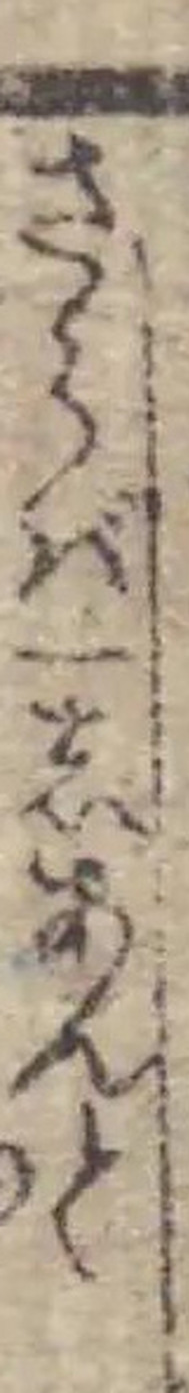さらば一しあんと
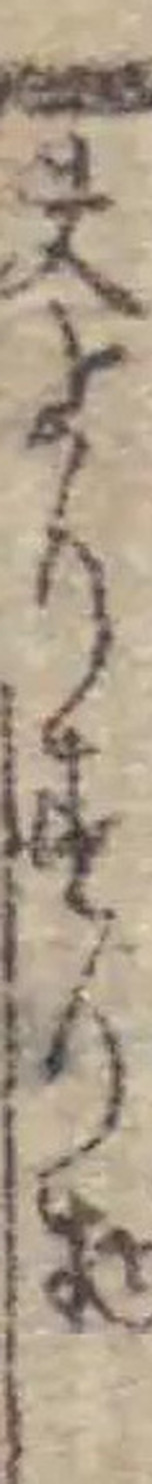夫よりすり物
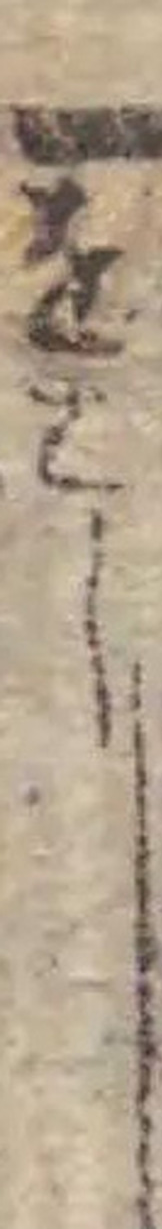をこし
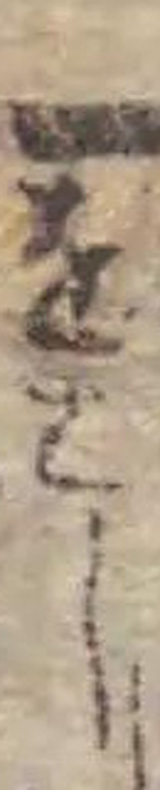をこし
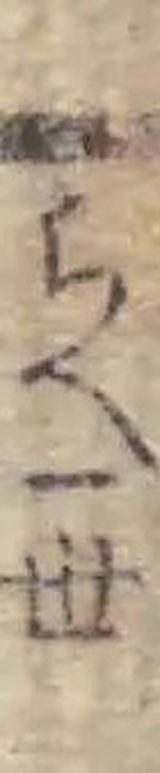らへ一世
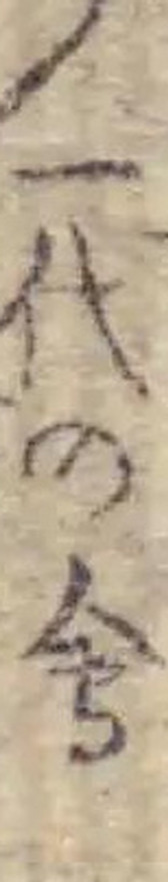一代の会
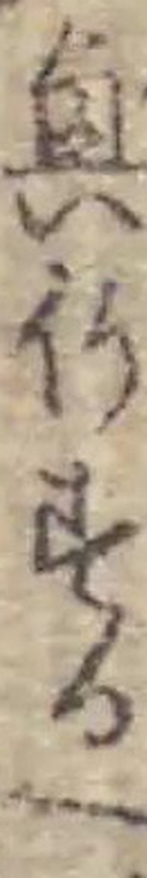興行する
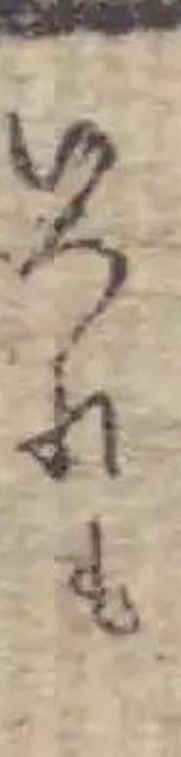いつれも
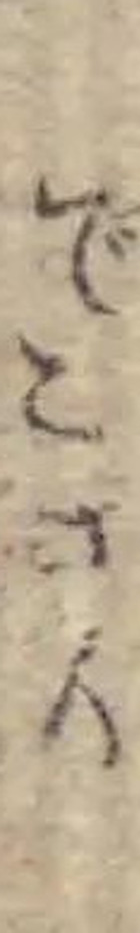でこさり
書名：作意妖恐懼感心 2巻
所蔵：国立国会図書館 National Diet Library, JAPAN
